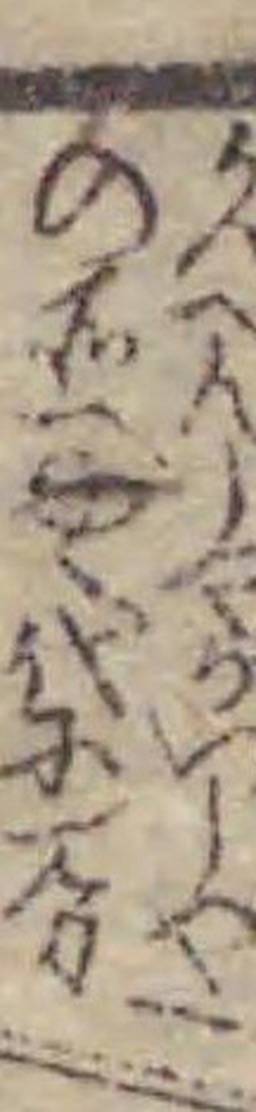の所へやく代に一分
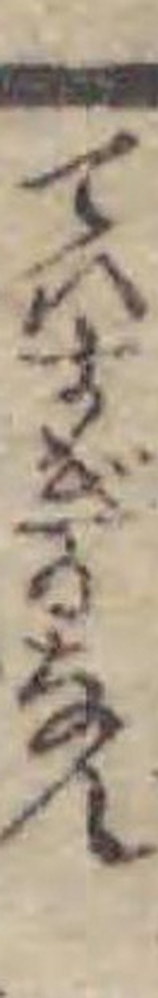てはすぎるなん
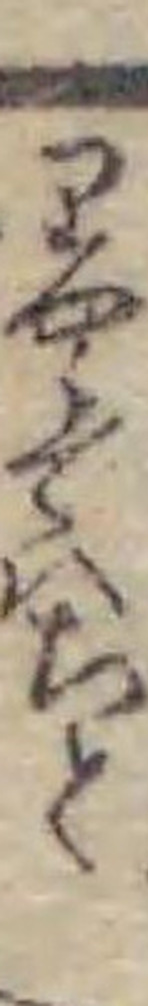りやうてはちと
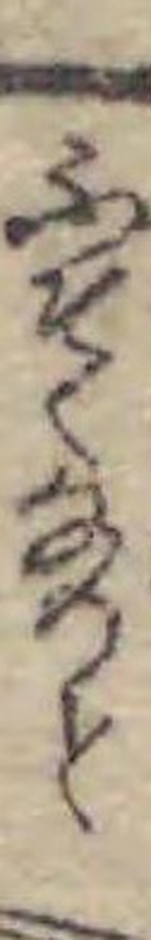ふそくなりと
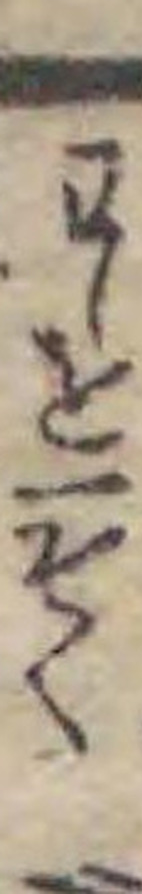わしを一そく
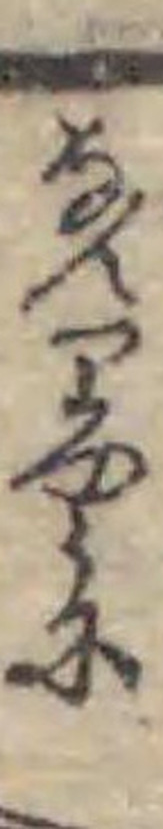なんりやうに
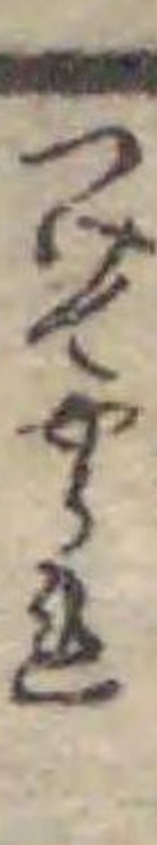つけてやられ
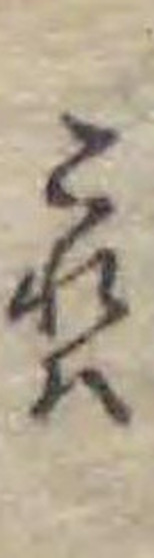これは
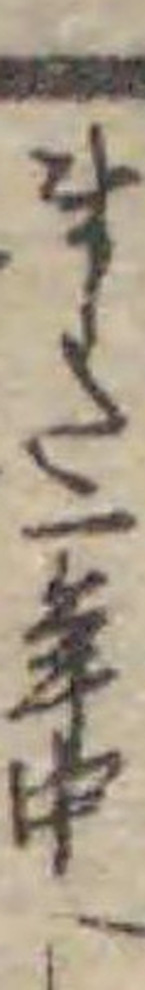ました一年中
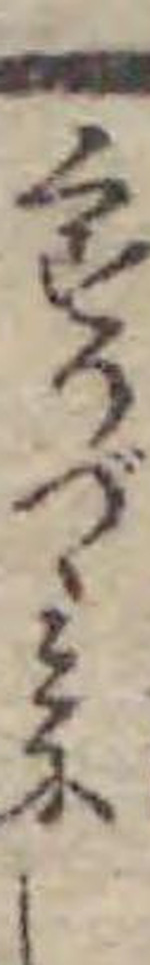くすりづゝみに
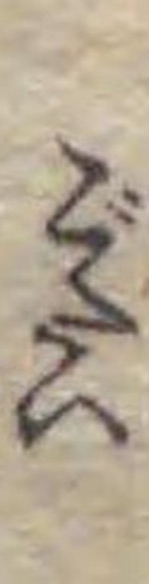ごたい
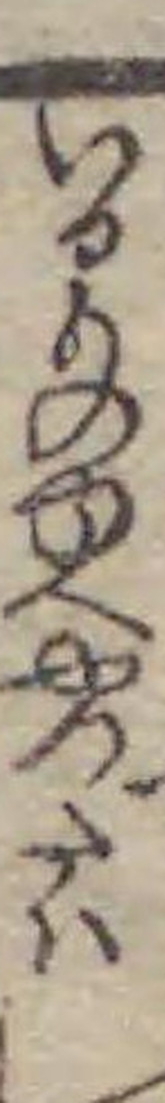いるものゆへやつたは
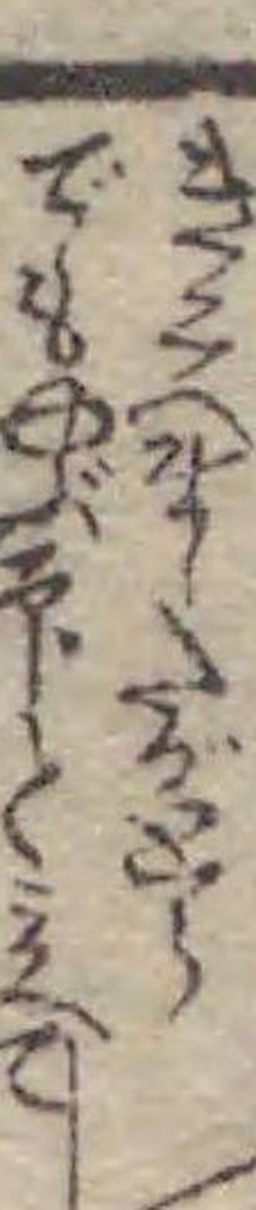でもやぶ印とみへて
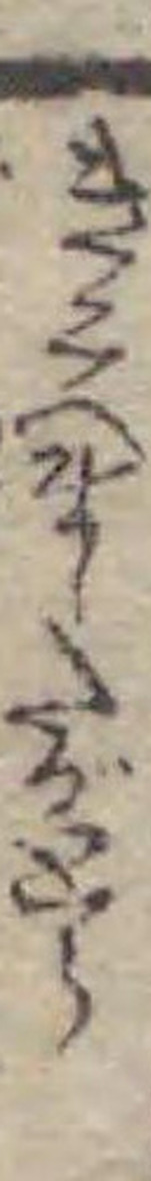きこへましたがとう
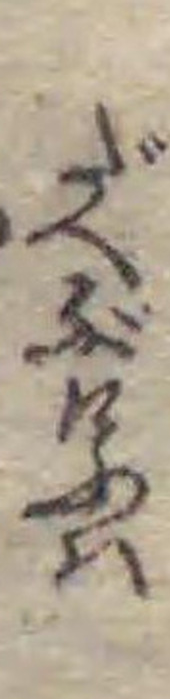だへぶけふは
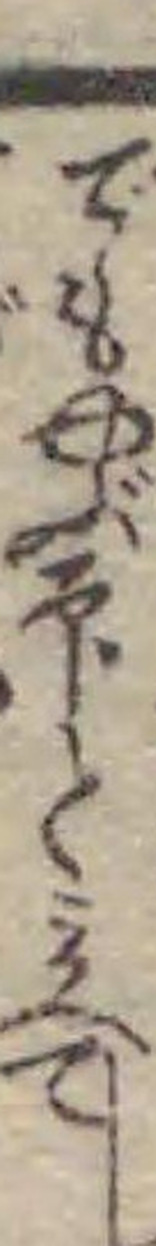でもやぶ印とみへて
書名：紙屑身上噺 : 3巻
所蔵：国立国会図書館 National Diet Library, JAPAN
